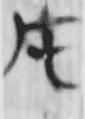厇
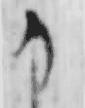人
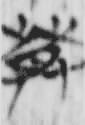登
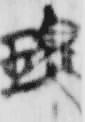環
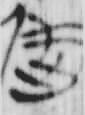○（屈）
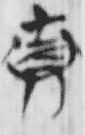賈
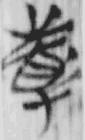○（文）
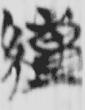○（紳）
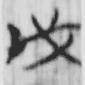戊
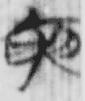寅
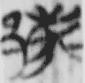鄜
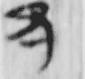邑
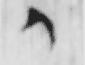人
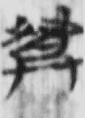登
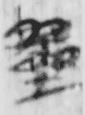壘
